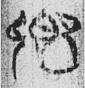鄉（饗）
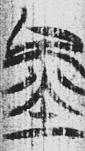○（舜）
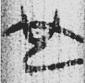也
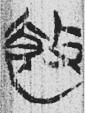飯
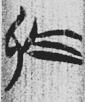於
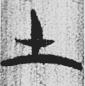土
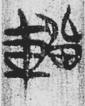○（簋）
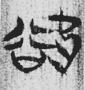欲〈歠〉
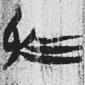於
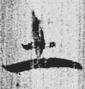土
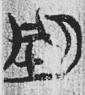型（鉶）
